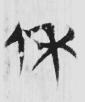休
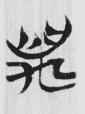萬
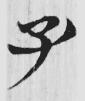子
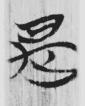是
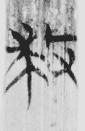救
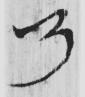乃
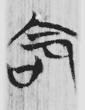命
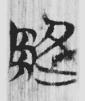陞
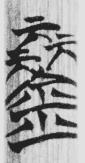{亓亓亓金}
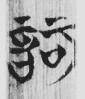訶
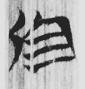於
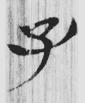子
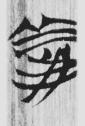義
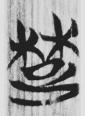楚
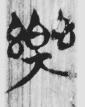樂
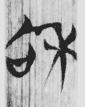和
